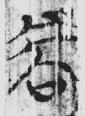○（乎）
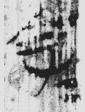孔子
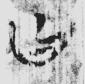曰
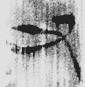又（有）
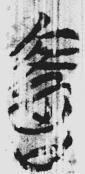○（顏）
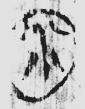囦（淵）
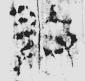敢（敢）
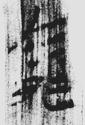{尒䎽}（問）
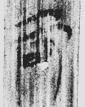可（何）
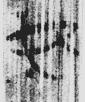女（如）
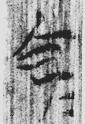孔子
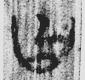曰
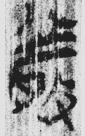敬
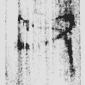又（有）
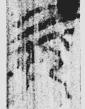而
